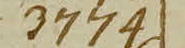3774
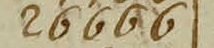26666
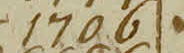1706
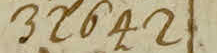32642
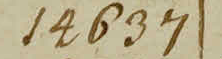14637
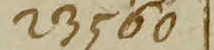23560
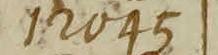12045
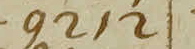9212
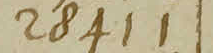28411
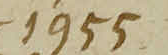1955
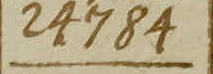24784
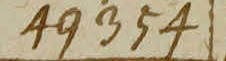49354
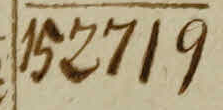152719
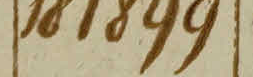181899
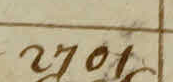2701
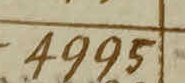4995
